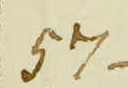57
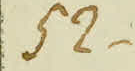52
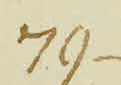79
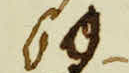69
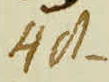48
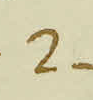2
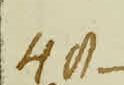48
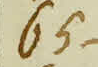65
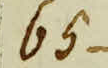65
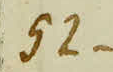52
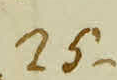25
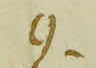9
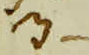3
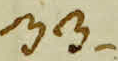33
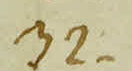32
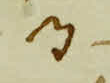3
